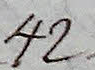42
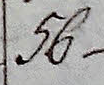56
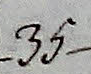35
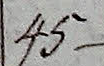45
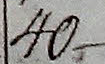40
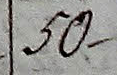50
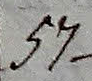57
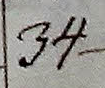34
